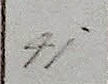41
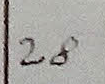28
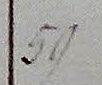59
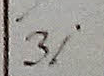31
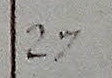27
